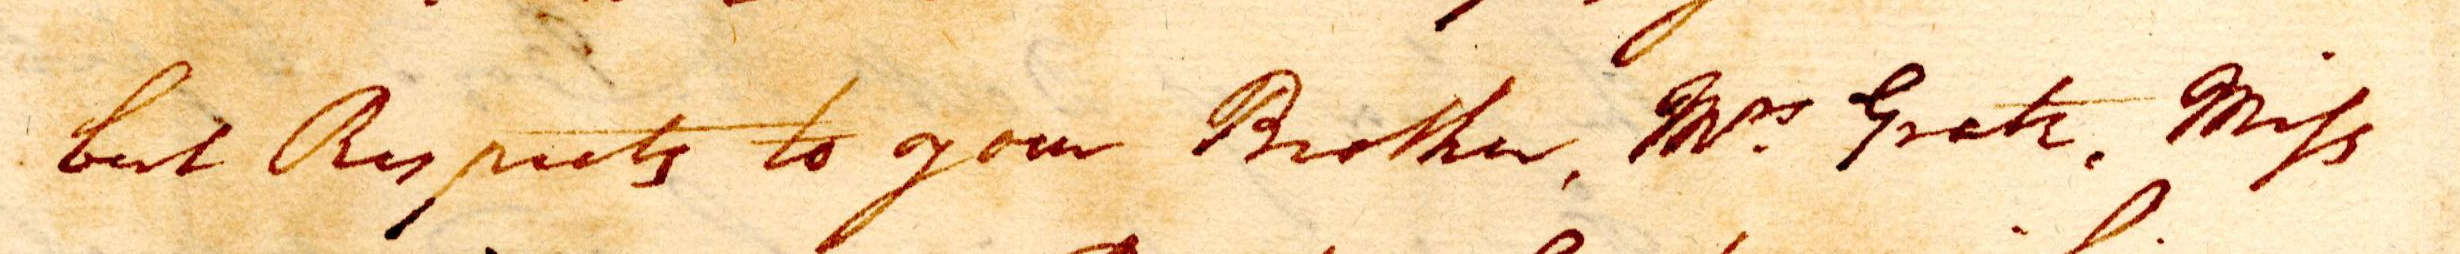best Respects to your Brother, M^rs. Gratz, Miss
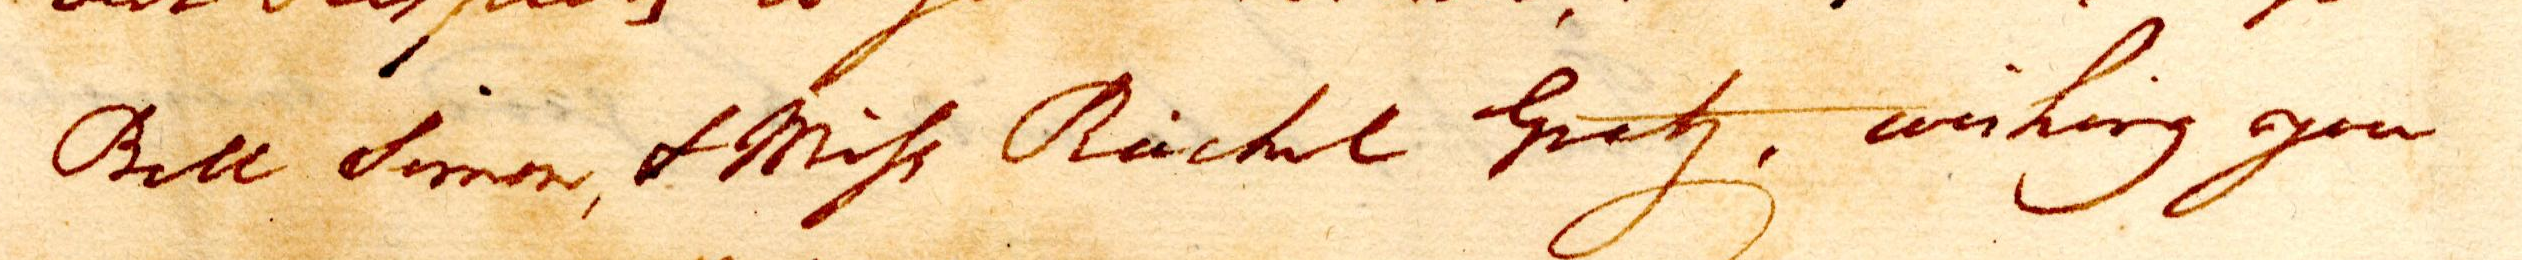Bell Simon, & Miss Rachal Gratz, wishing you
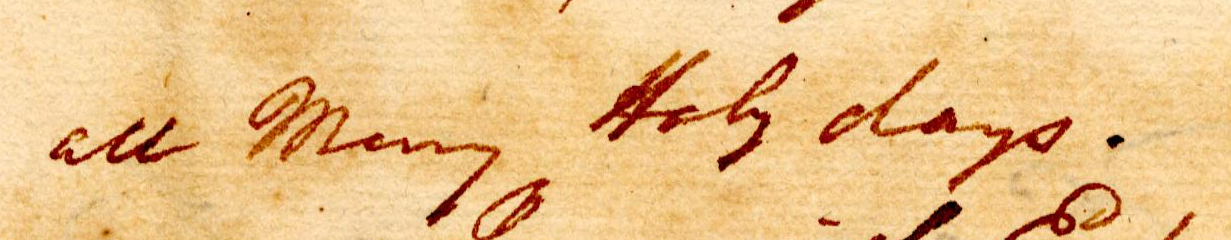all many Holy days.
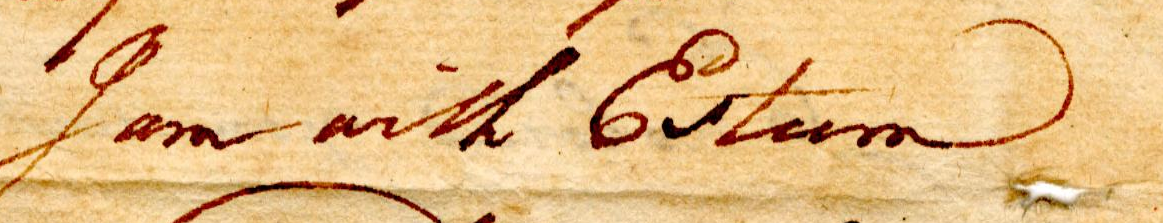I am with Esteem
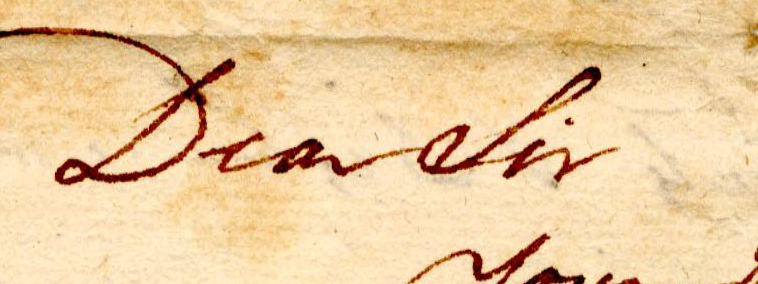Dear Sir
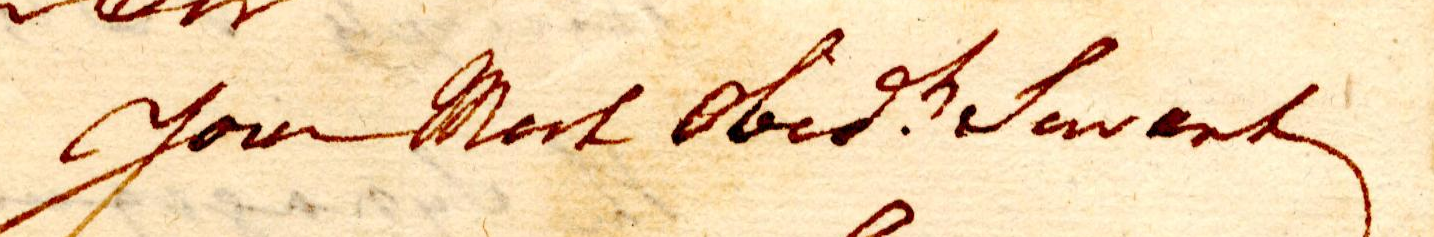Your most Obed^t. Servant
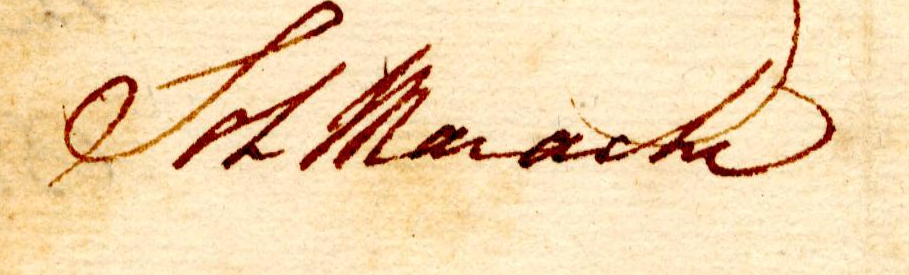Sol Marache
